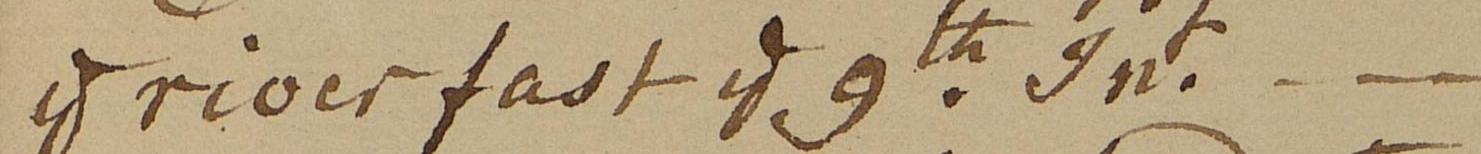y^e river fast y^e 9^th. In^t--
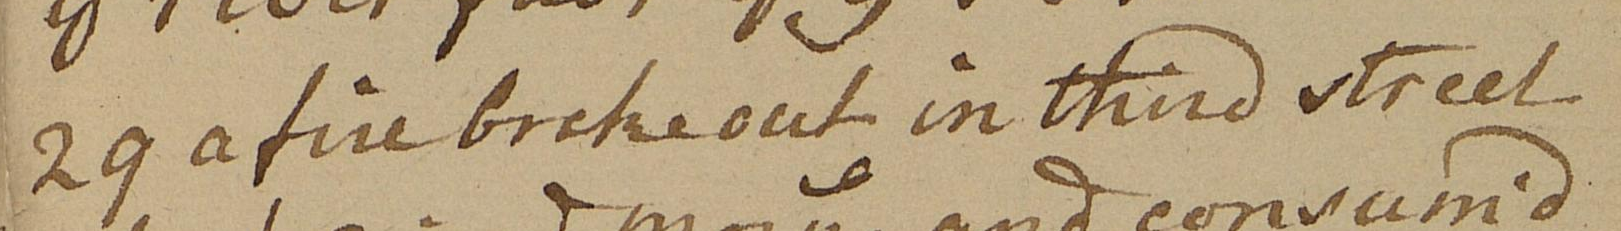29 a fire broke out in third street
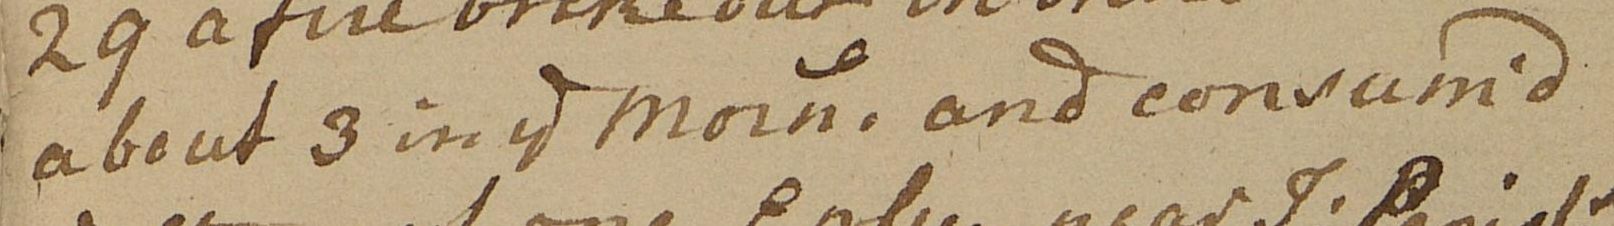about 3 in y^e morn and consum'd
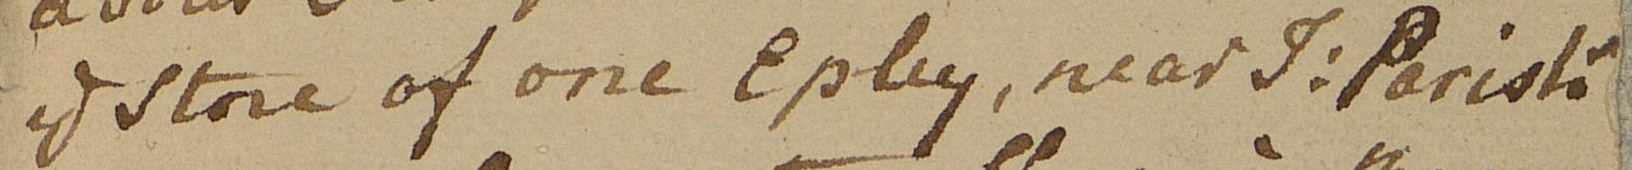y^e store of one Epley, near J: Parish^s
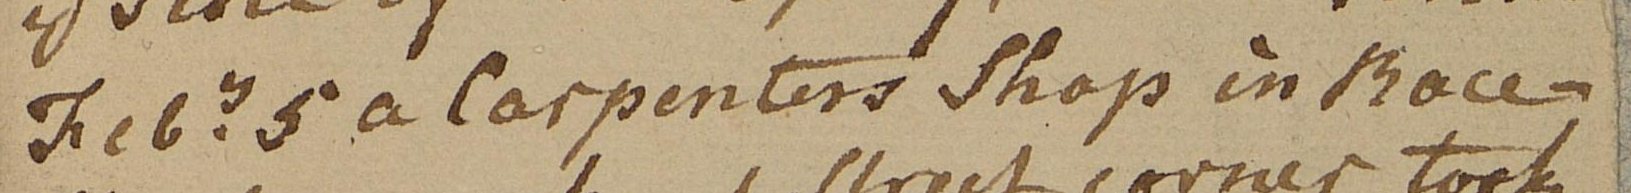Feb^y. 5 a Carpenters Shop in Race-
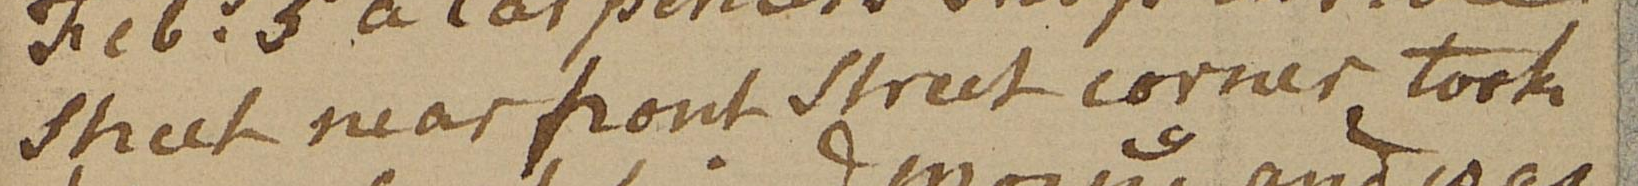Street near front street corner took
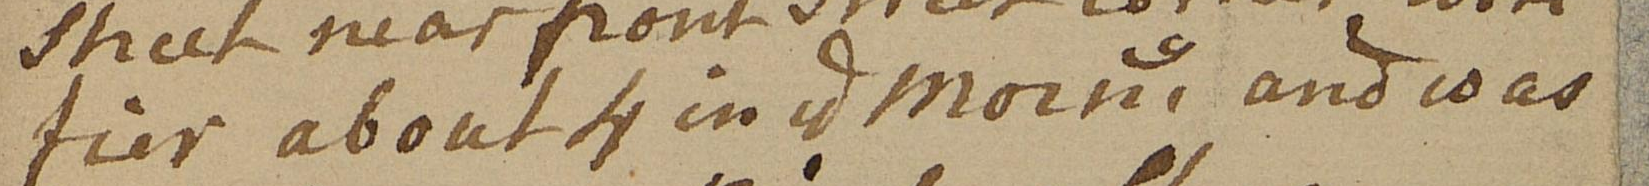fier about 4 in y^e morn^g. and was
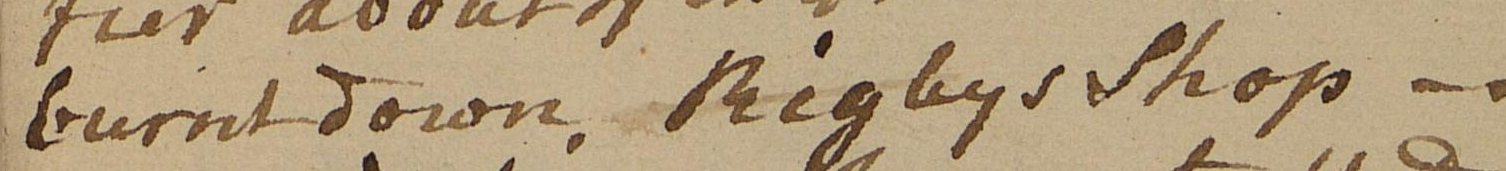burnt down, Rigleys Shop-
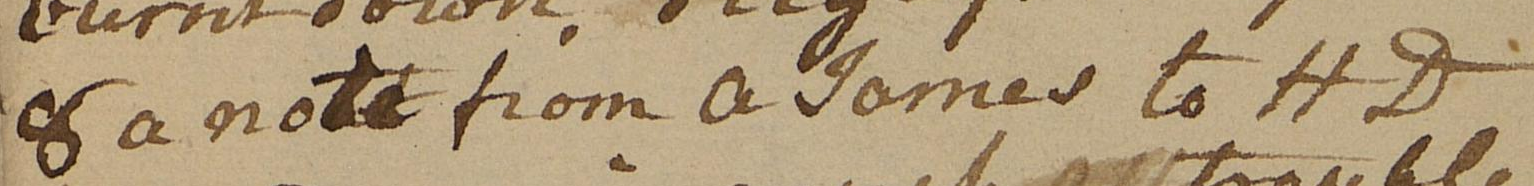8 a note from A James to HD
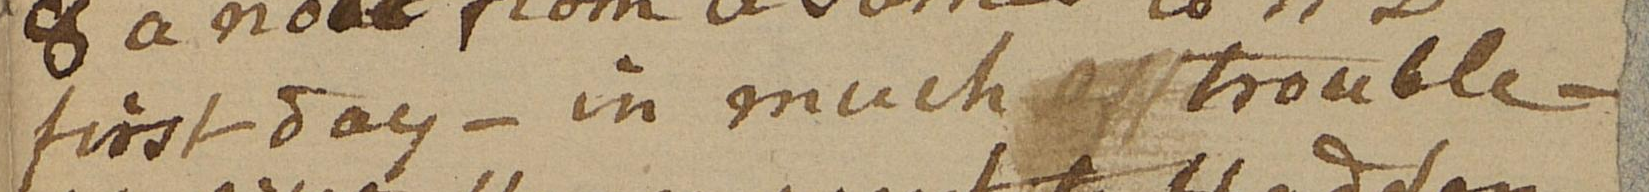fiost day- in much [___] trouble-
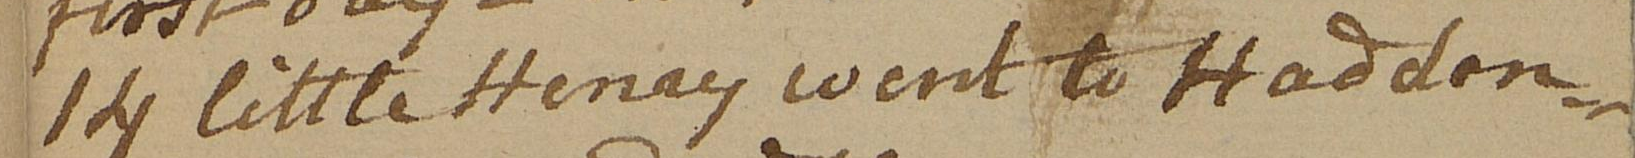14 little Henry went to Haddon-
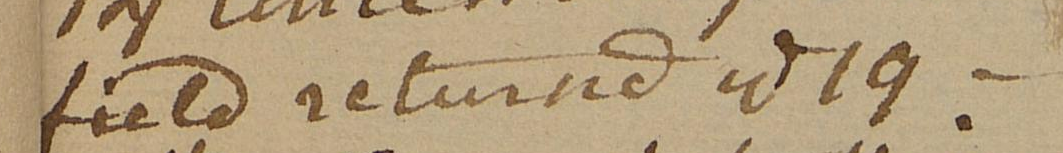field returnd y^e 19-
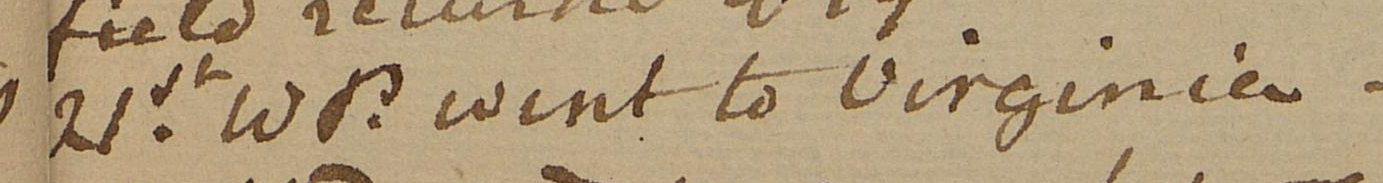21^st. WP. went to Virginia -
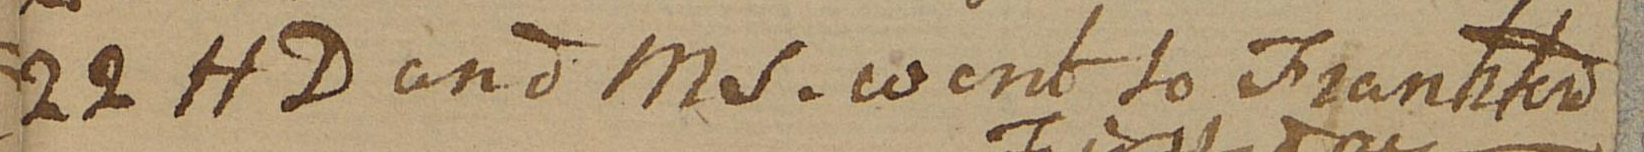12 HD and MS. went to Frankford
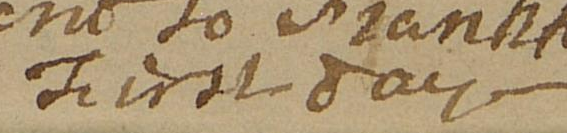First day-
